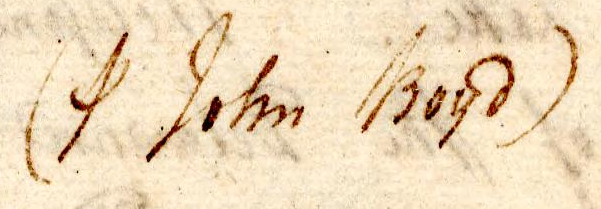(To John Boyd)
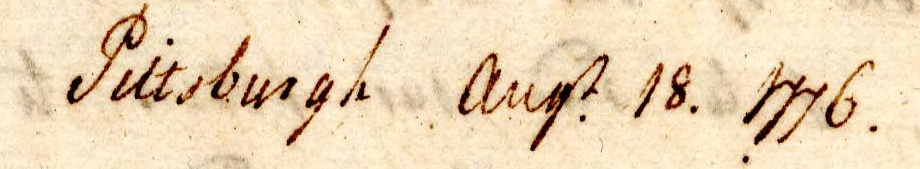Pittsburgh Aug^t. 18. 1776.
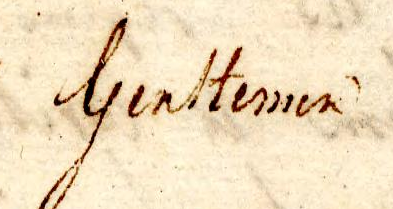Gentlemen
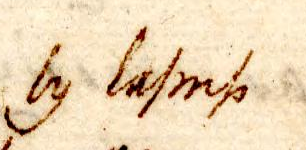by Express
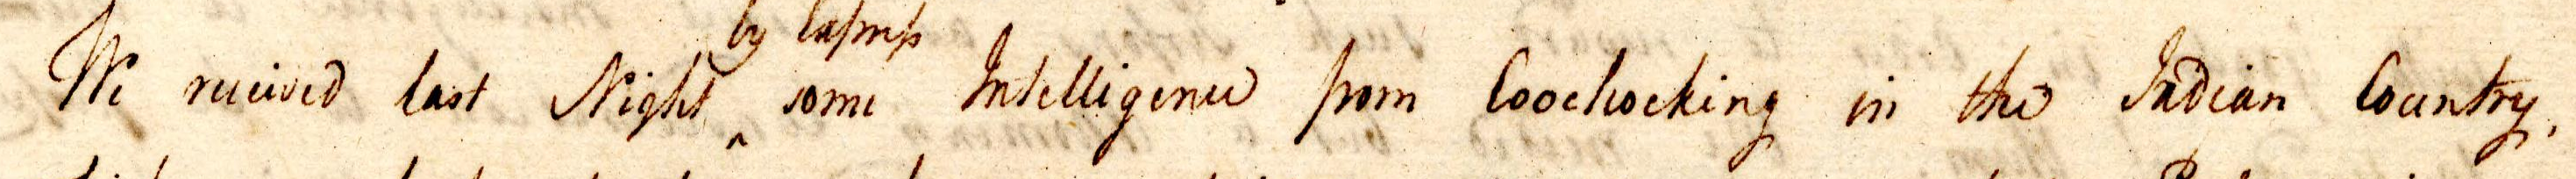We received last Night ^ some Intelligence from Coochocking in the Indian Country,
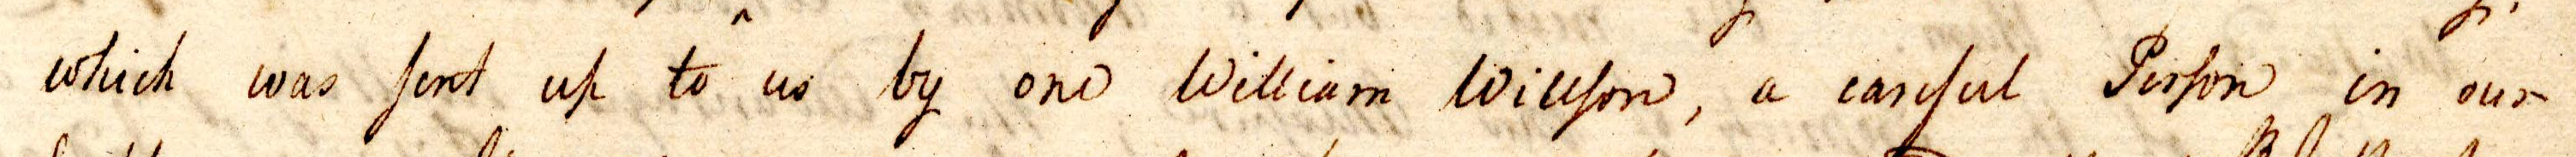which was sent up to us by one William Willson, a careful Person in our
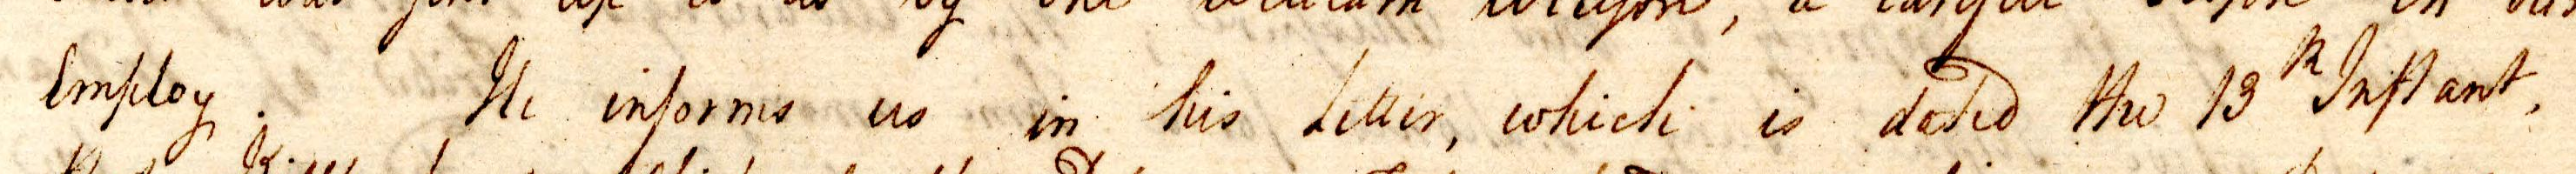Employ. He informs us in his Letter, which is dated the 13^th Instant,
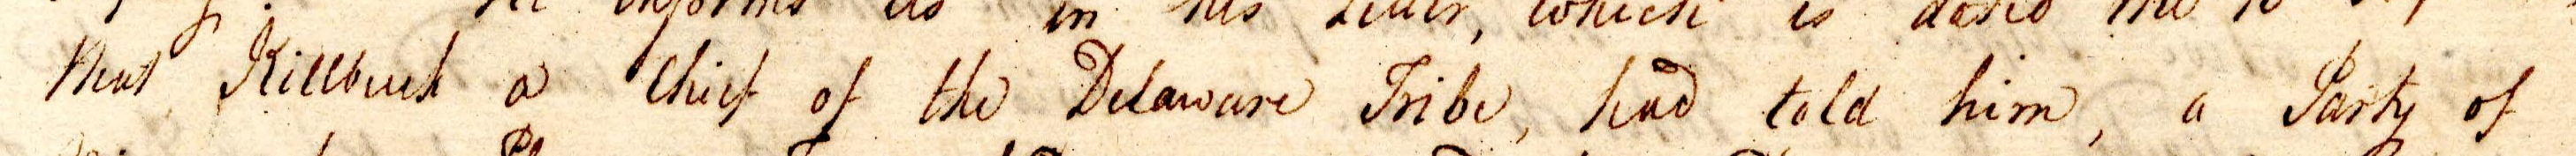that Killbuck a Chief of the Delaware Tribe, had told him, a Party of
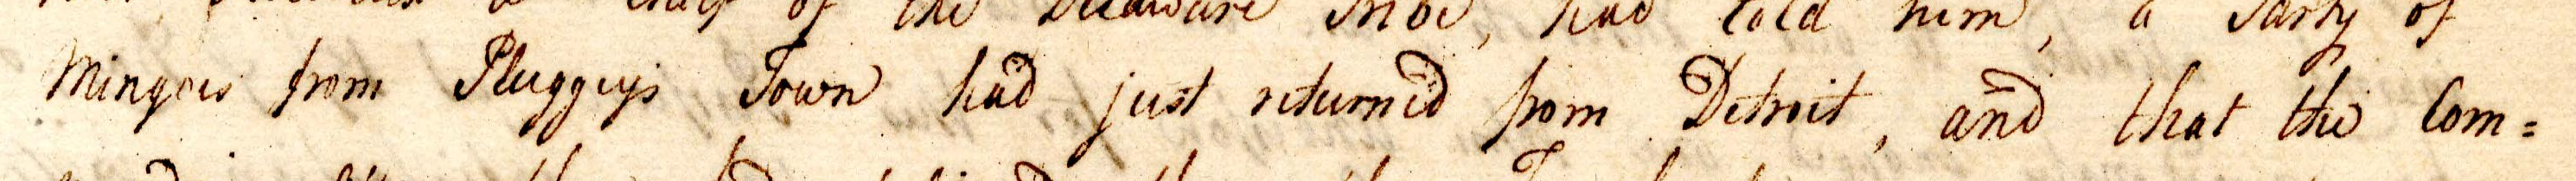Mingoes from Pluggey's Town had just returned from Detroit, and that the Com-
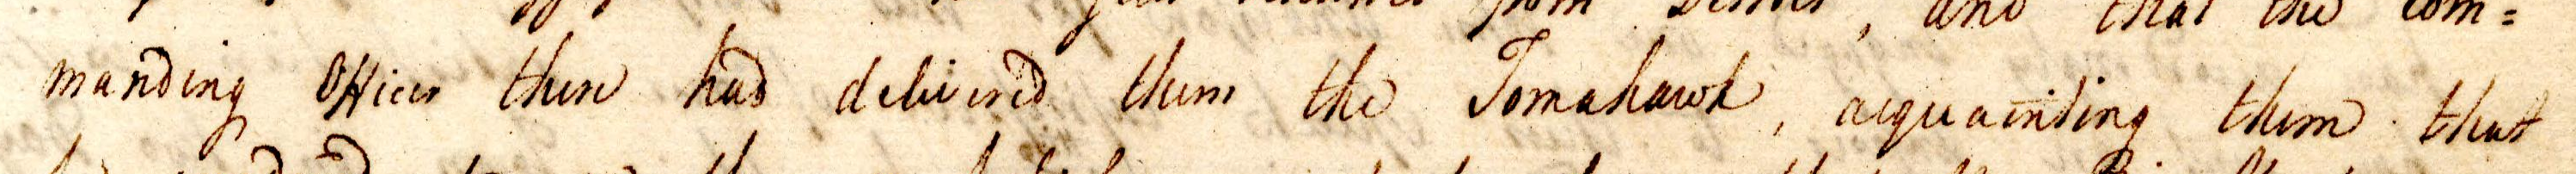manding Officer there had delivered them the Tomahawk, acquainting them that
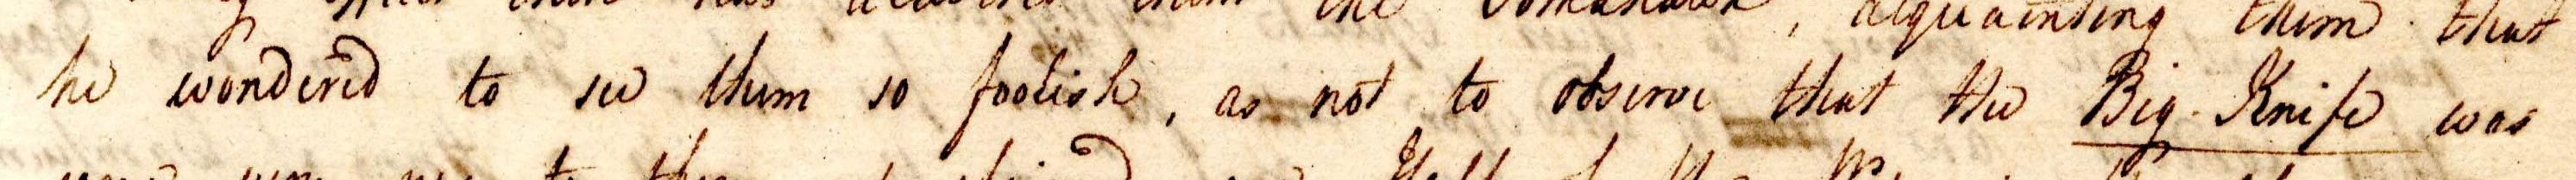he wondered to see them so foolish, as not to observe that the Big Knife was
